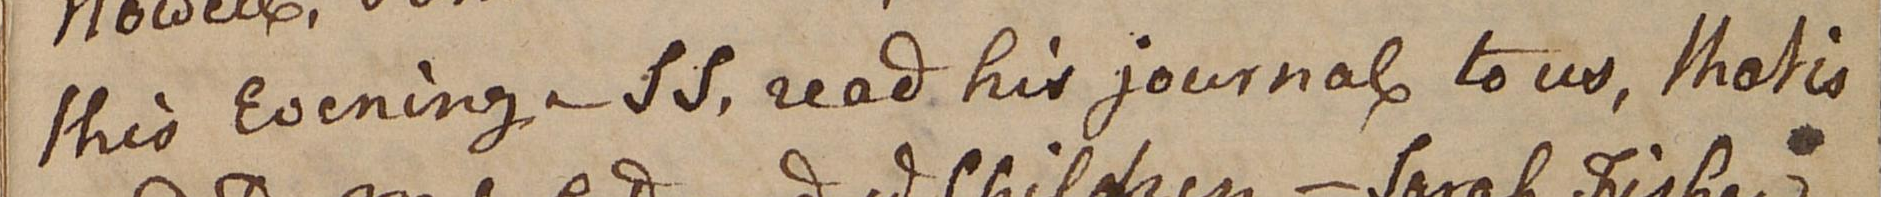this Evening- SS. read his journal to us, that is
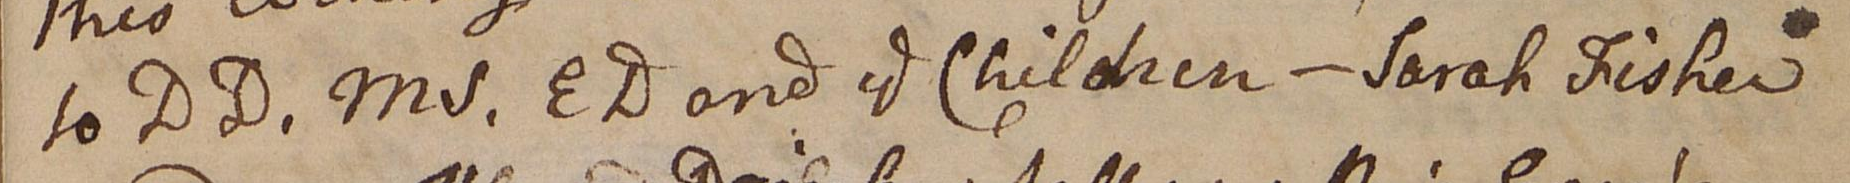to DD. MS. ED and y^e Children- Sarah Fisher
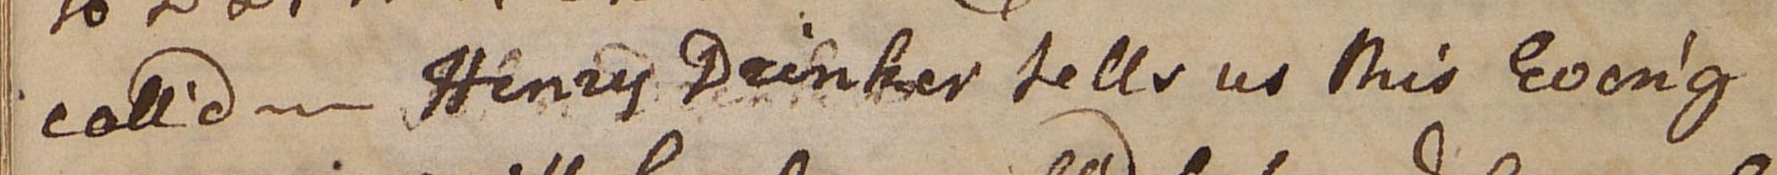call'd- Henry Drinker tells us this Even'g
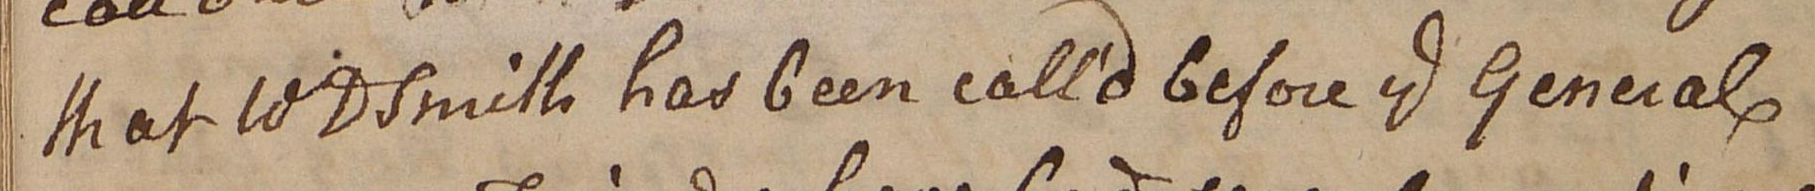that W D Smith has been call'd before y^e General
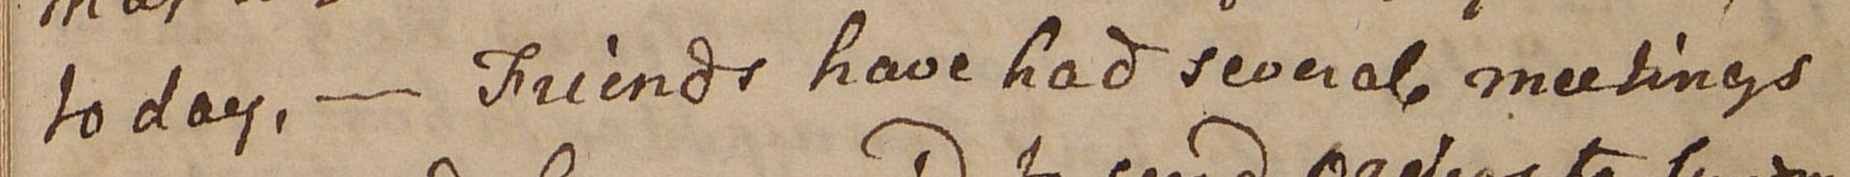to day.- Friends have had several meetings
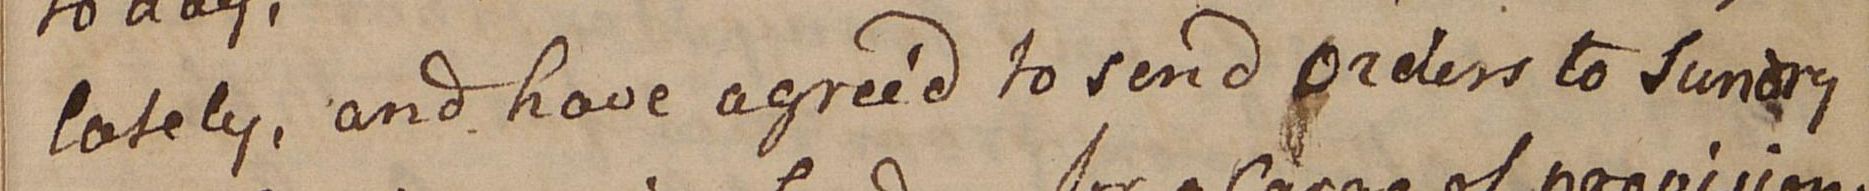lately, and have agree'd to send Orders to Sundry
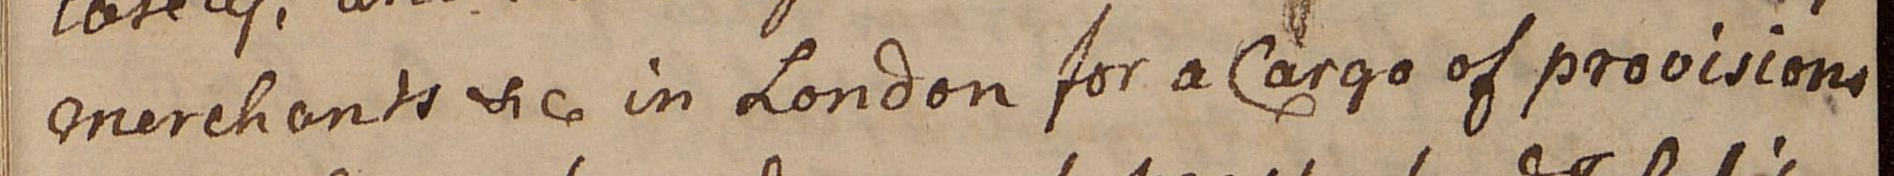merchants &c in London for a Cargo of provisions
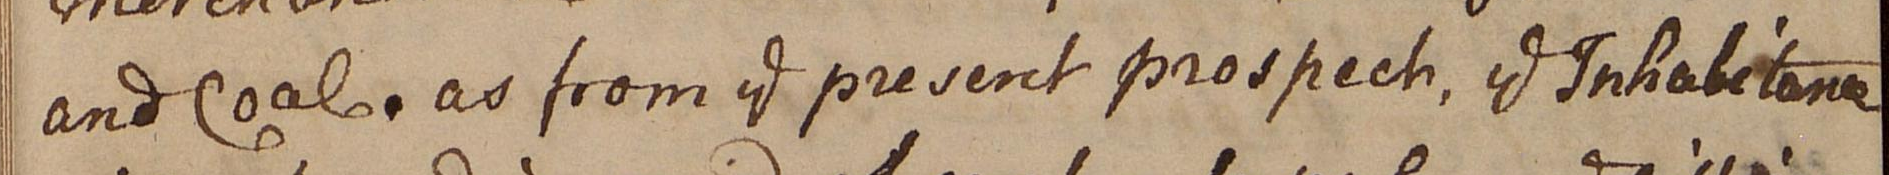and Coal, as from y^e present prospect, y^e Inhabitans
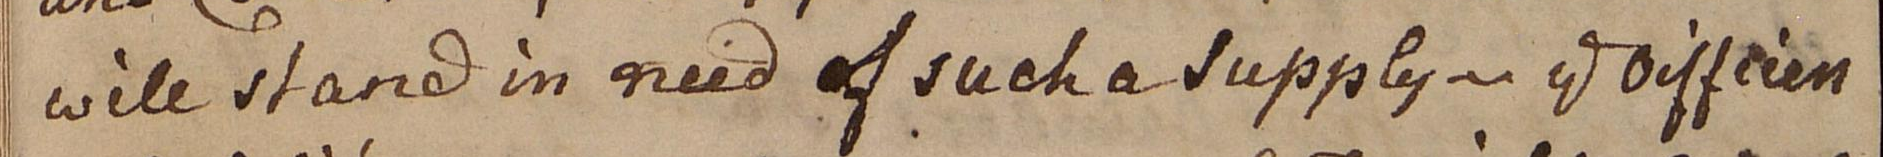will stand in need of such a Supply- y^e oiffeier
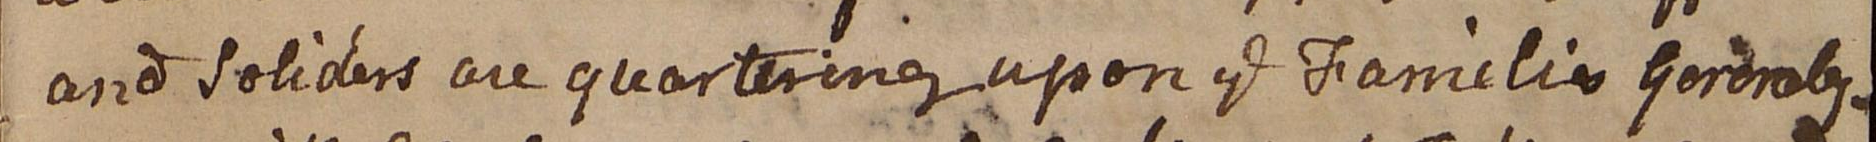and Soliders are quartering upon y^e Families Gorondy
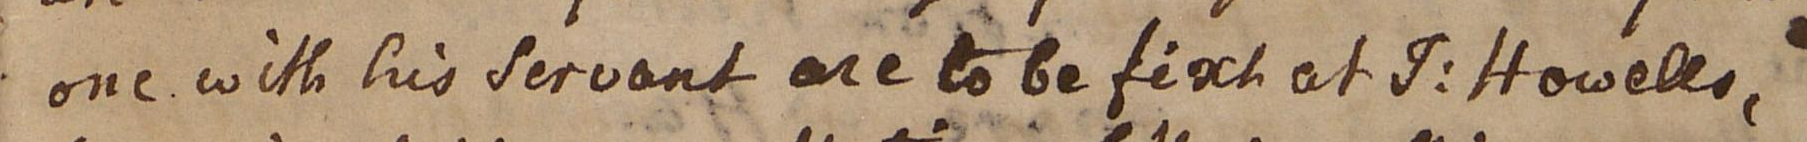one with his Servant are to be fixt at T: Howells,
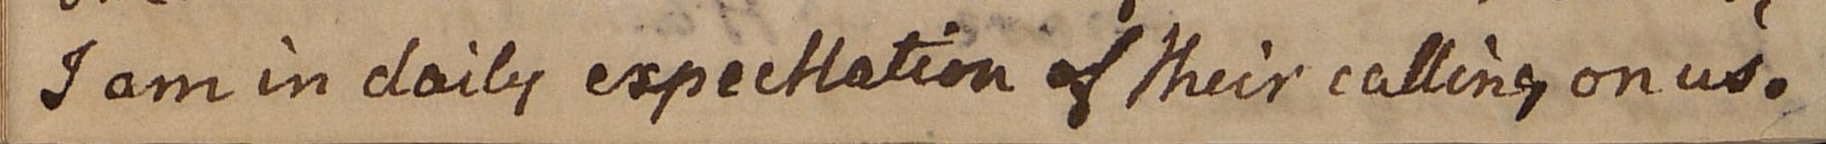I am in daily expecttation of their calling on us.
